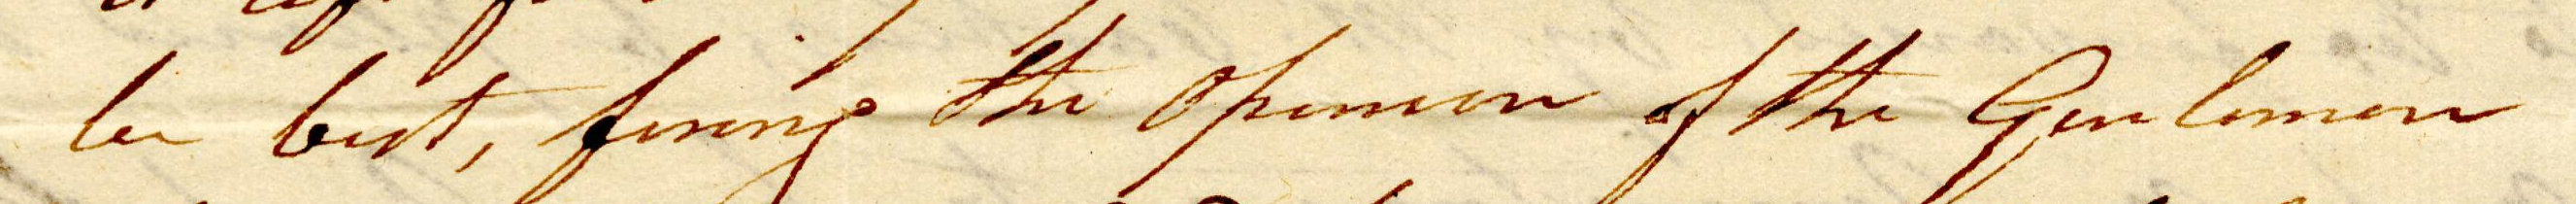be best, serving the opinion of the Gentlemen
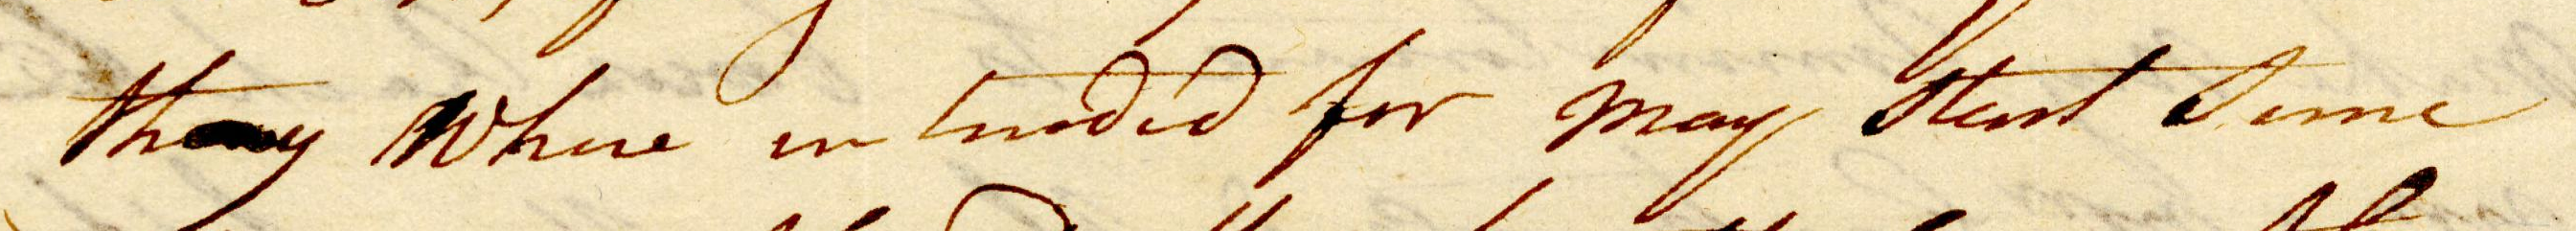they where intended for may start some
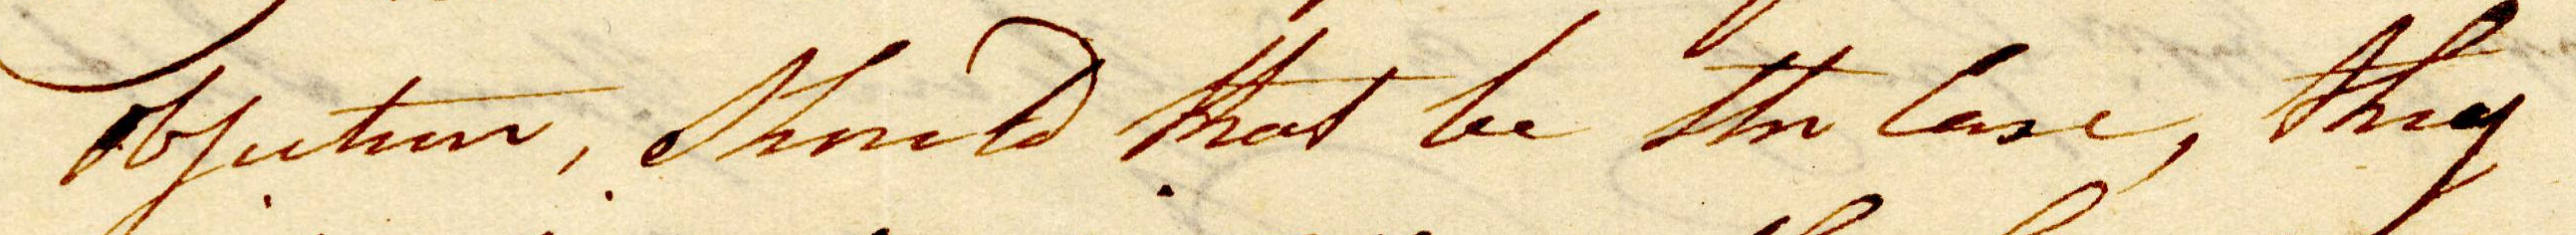objection, Should that be the case, they
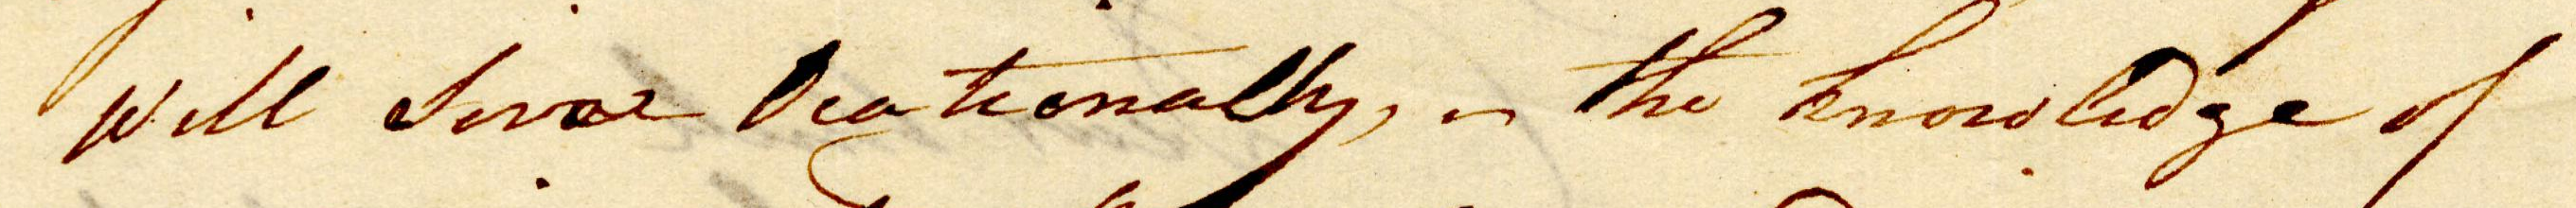will serve deationally- the knowledge of
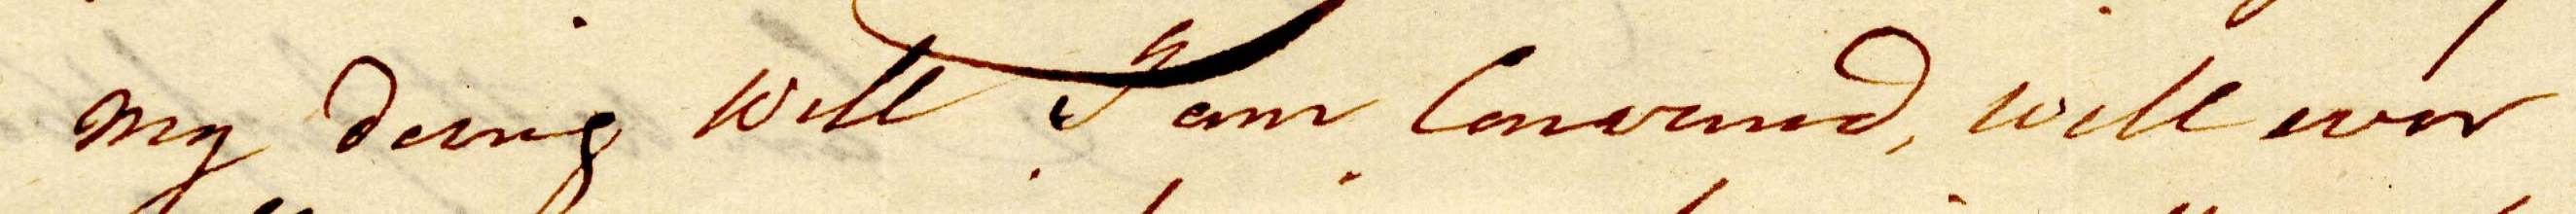my doing will I am convinced, will ever
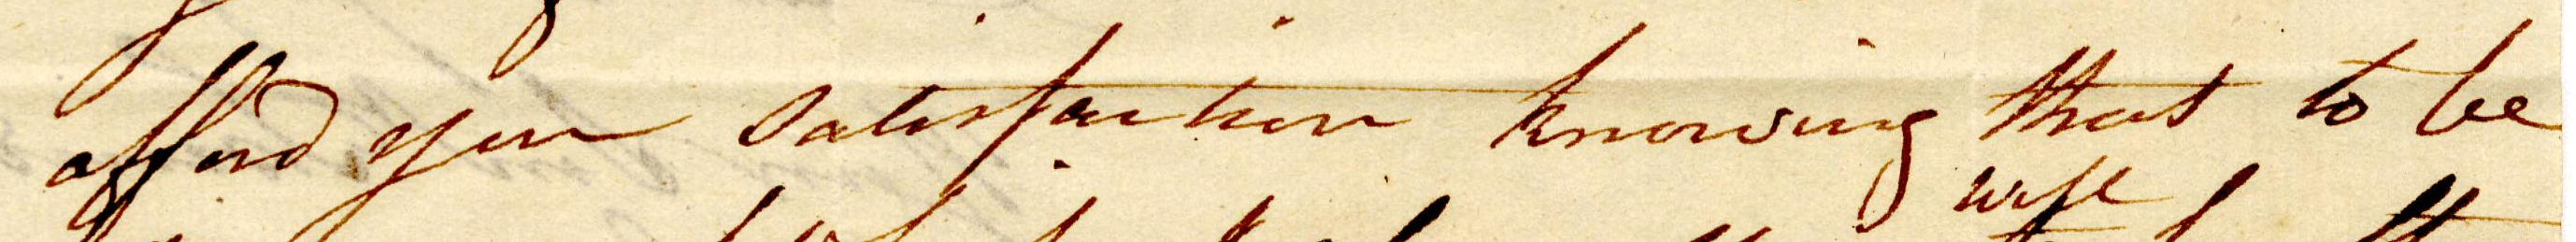afford you satisfaction knowing that to be
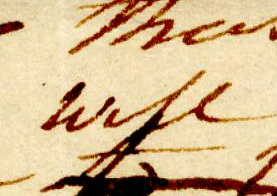will
